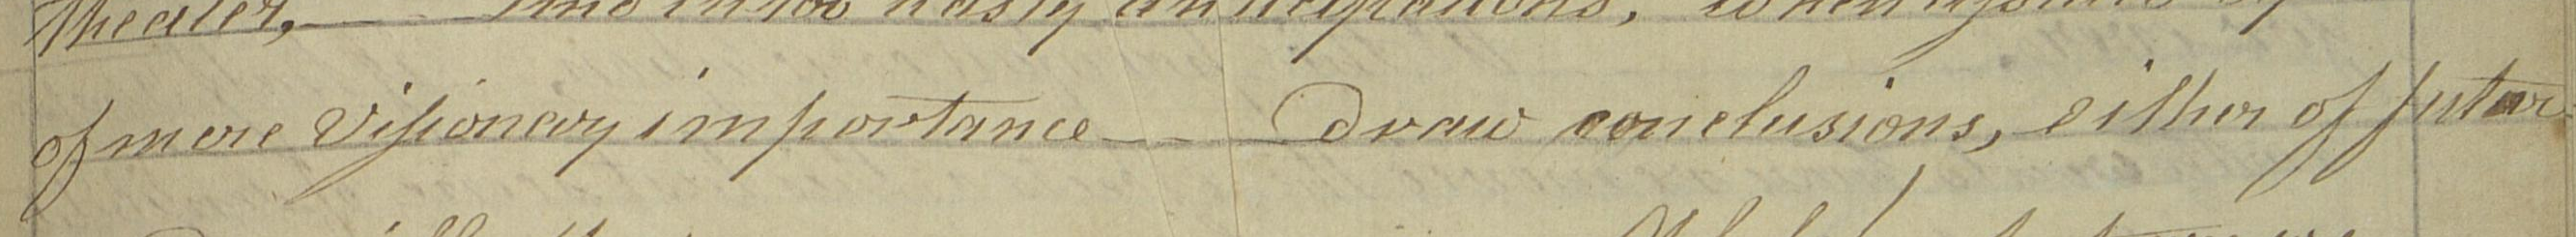of mere visionary importance draw conclusions, either of futur
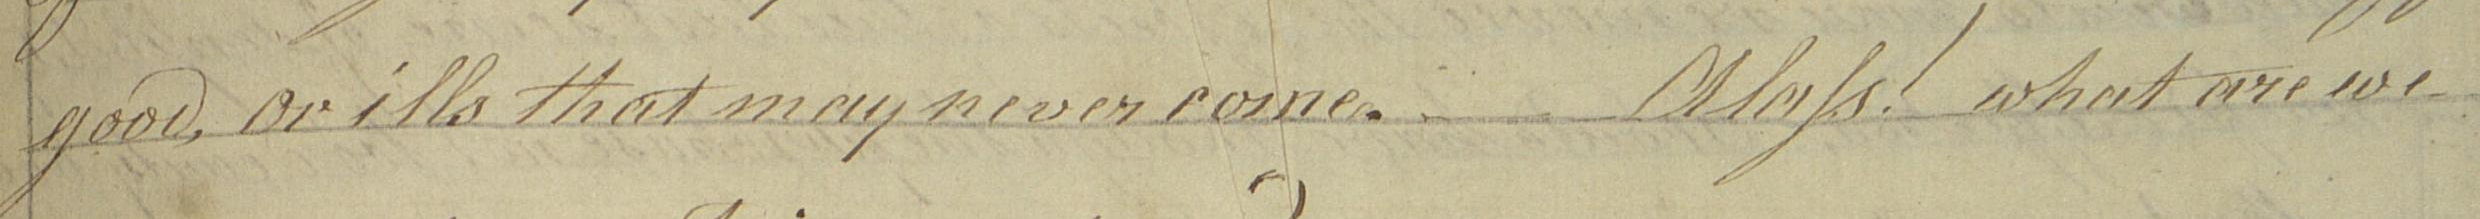good or ills that may never come. Alass! what are we
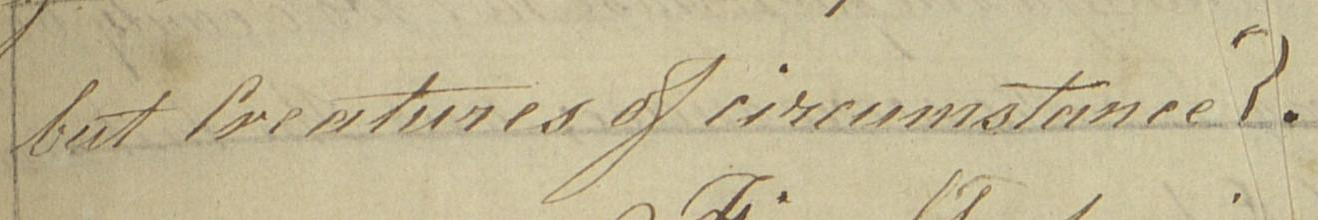but Creatures of circumstance?
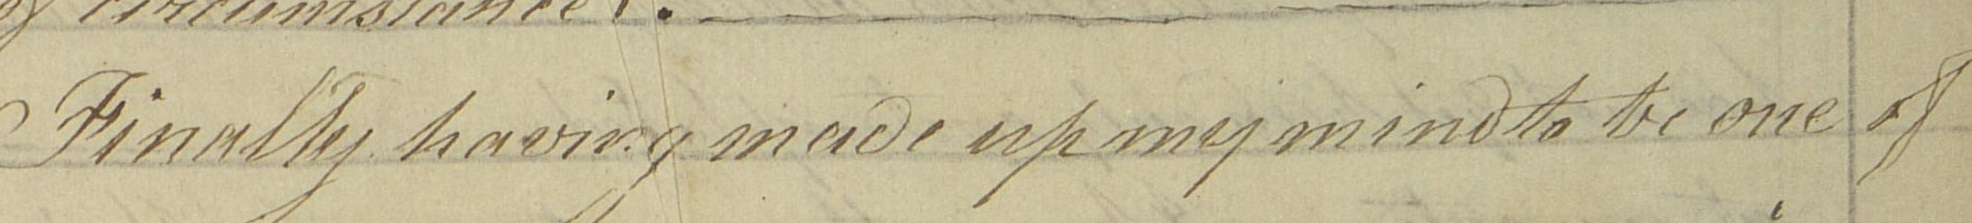Finally having made up my mind to be one of
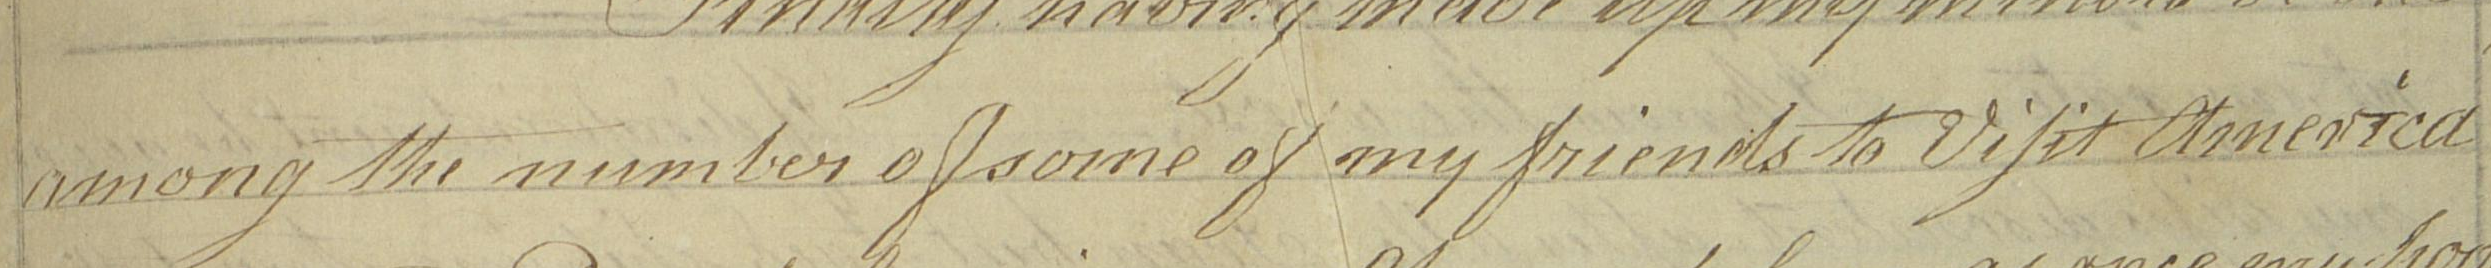among the number of some of my friends to Visit America
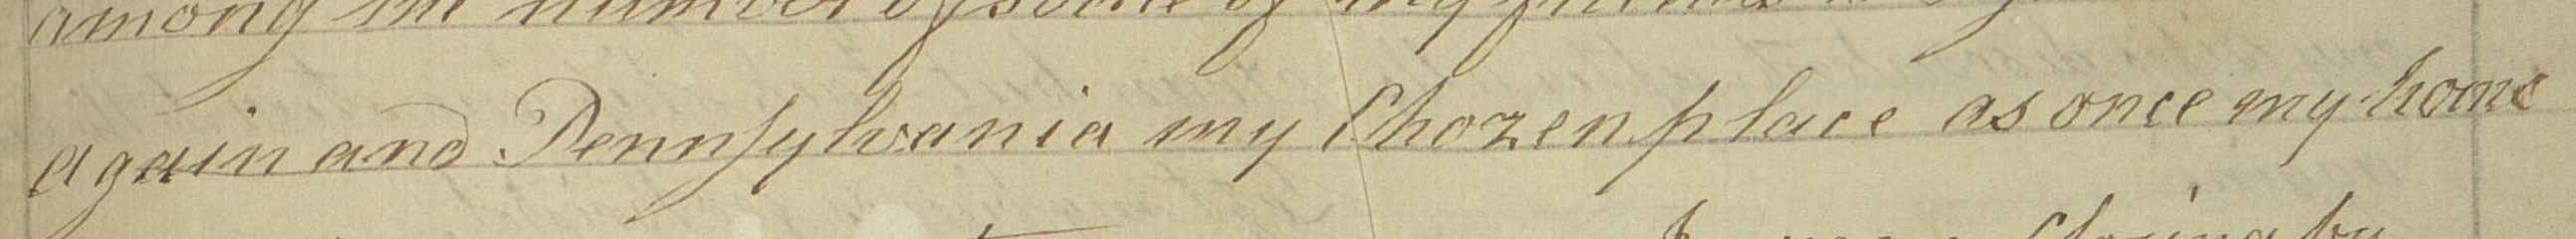again and Pennsylvania my Chozen place as once my home
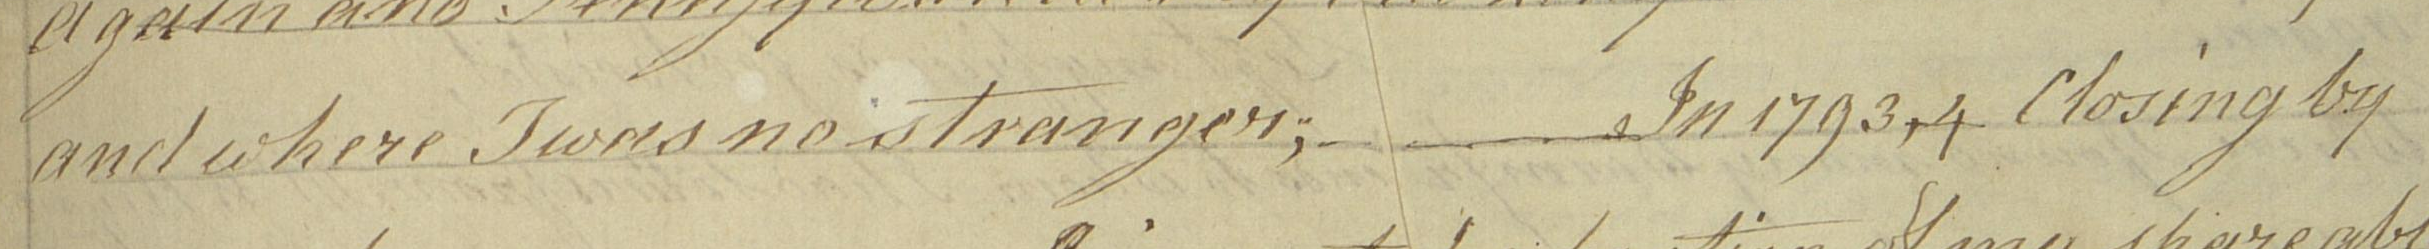and where I was no stranger; In 1793-4, Closing by
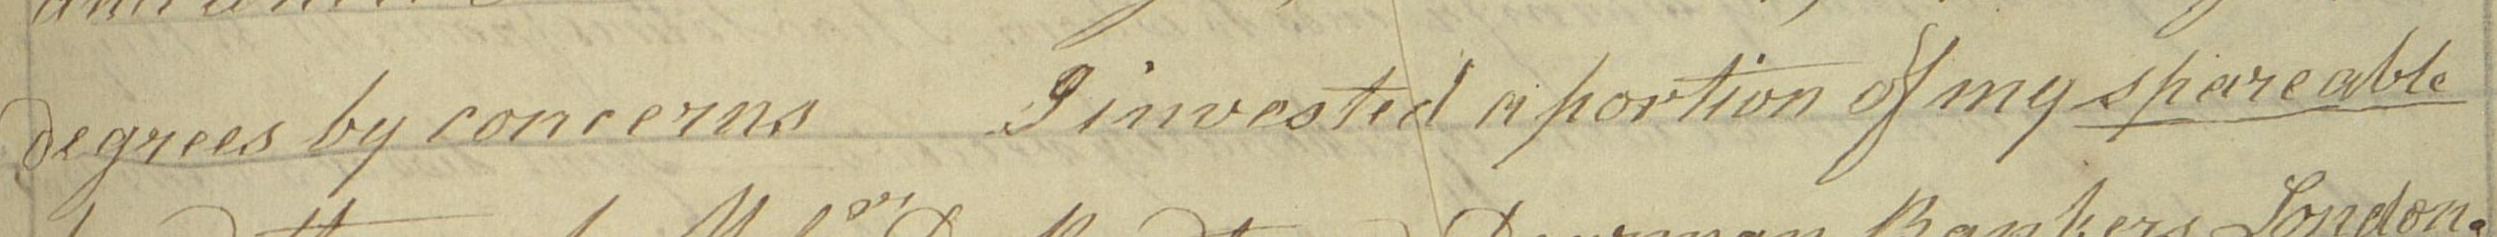degrees by concerns I invested a portion of my spareable
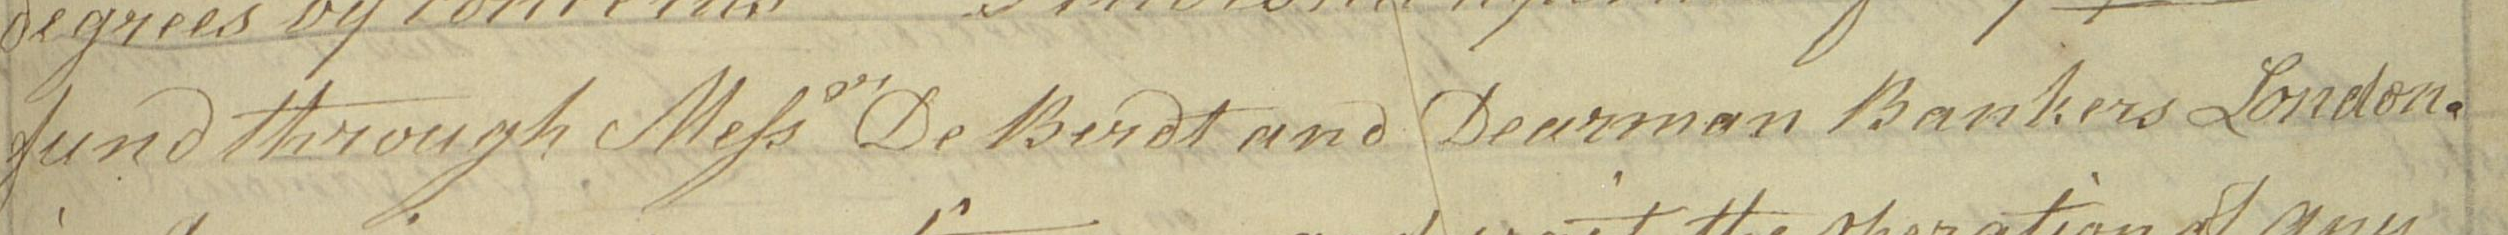fund through Mess^r. De Berdt and Dearman Bankers London,
